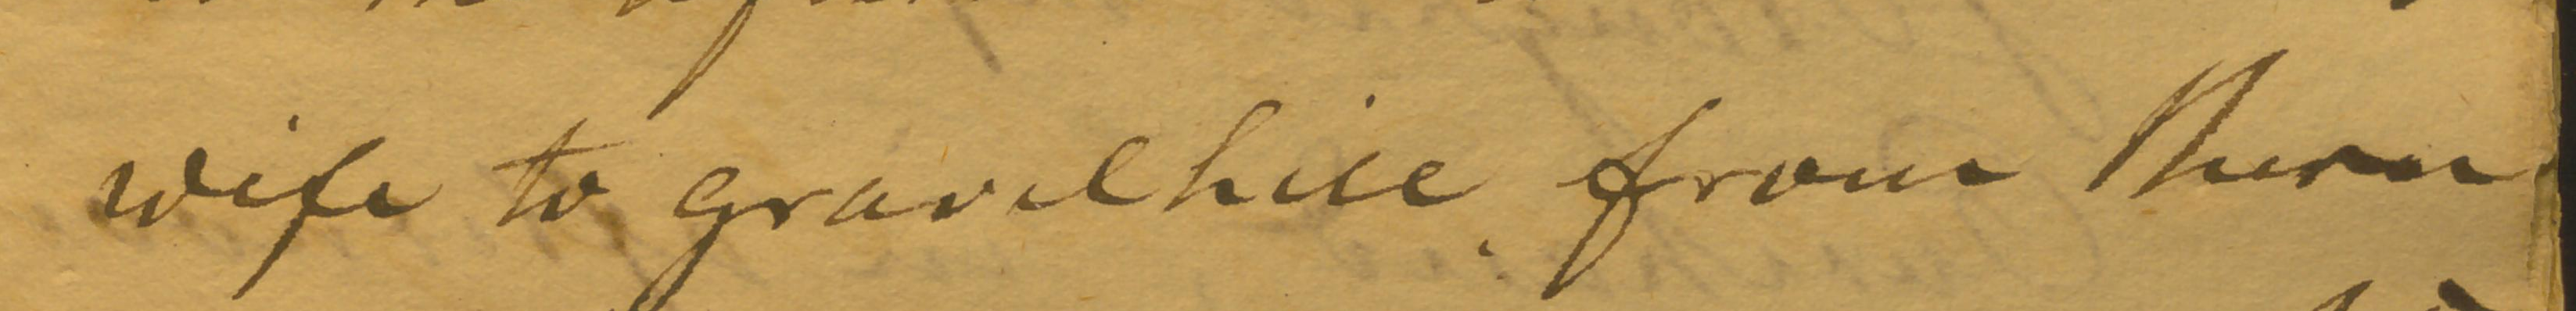wife to gravelhill froue thence
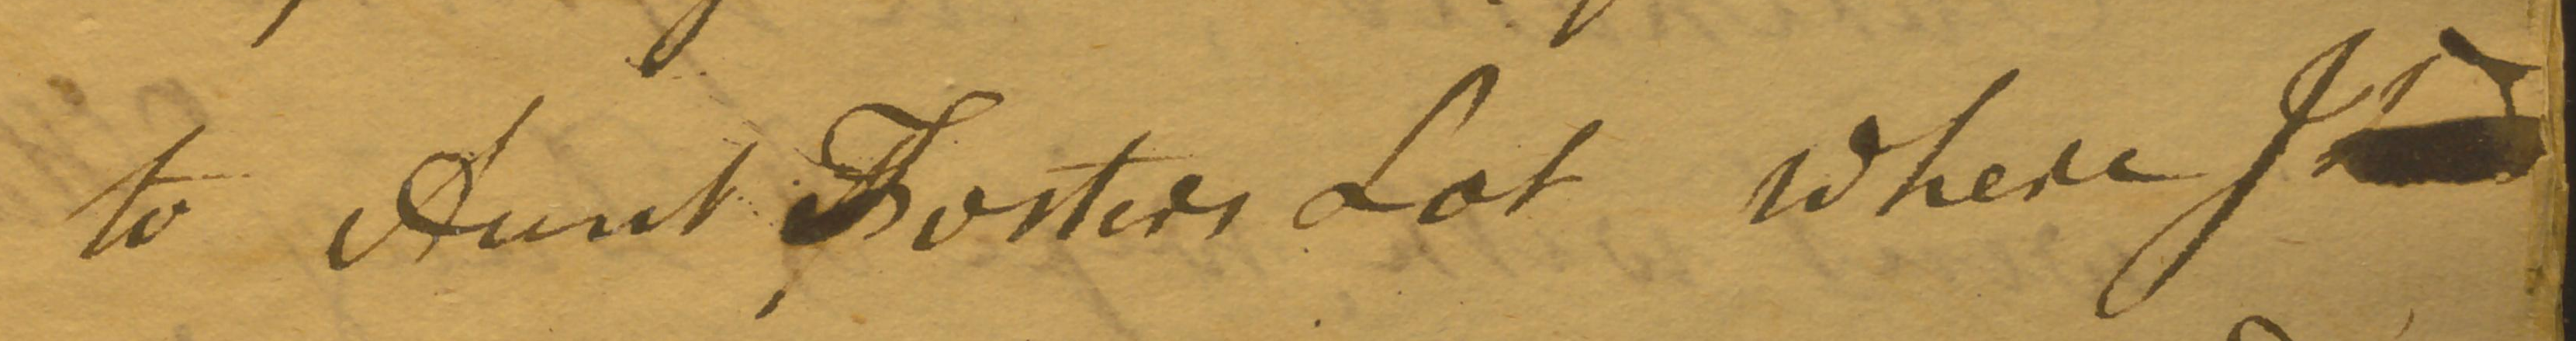to Aunt Fosters Lot where I [had]
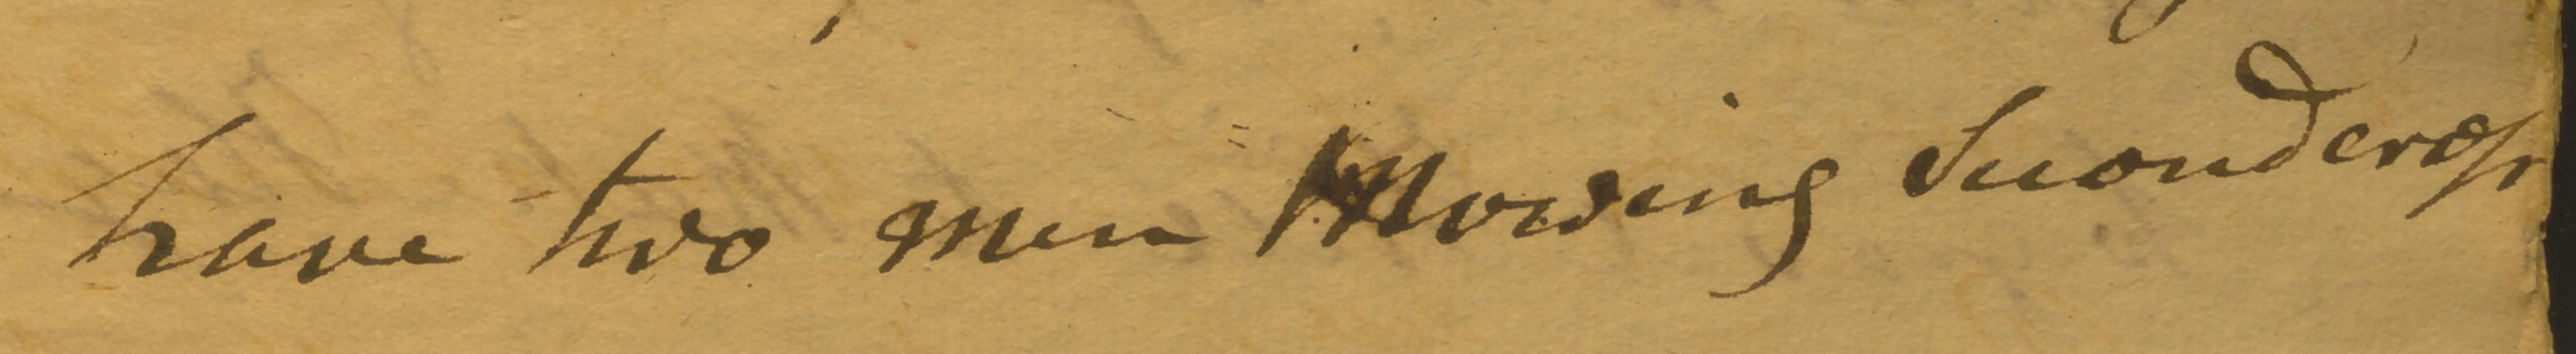have two Men Mowing second crop
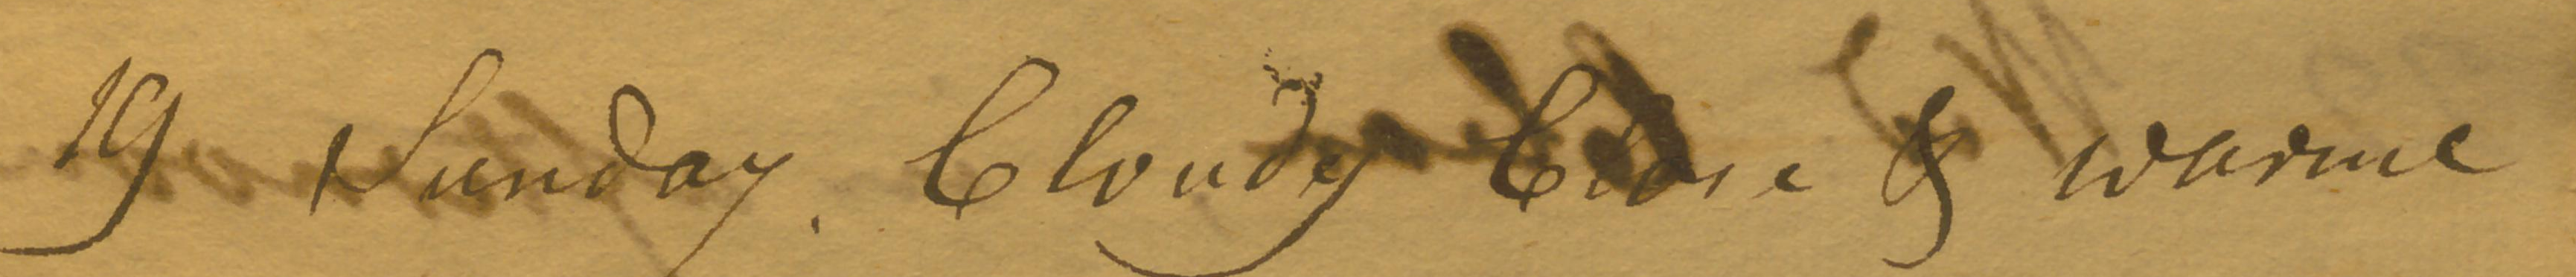19 Sunday Cloudy Close & warme
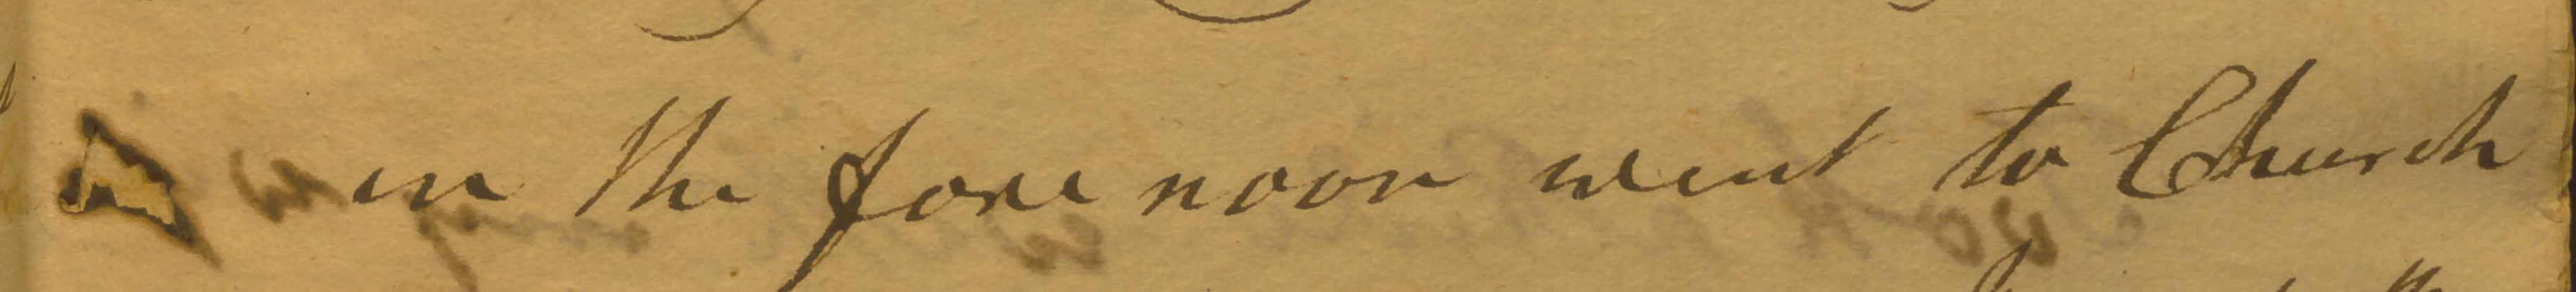in the fore noon went to Church
